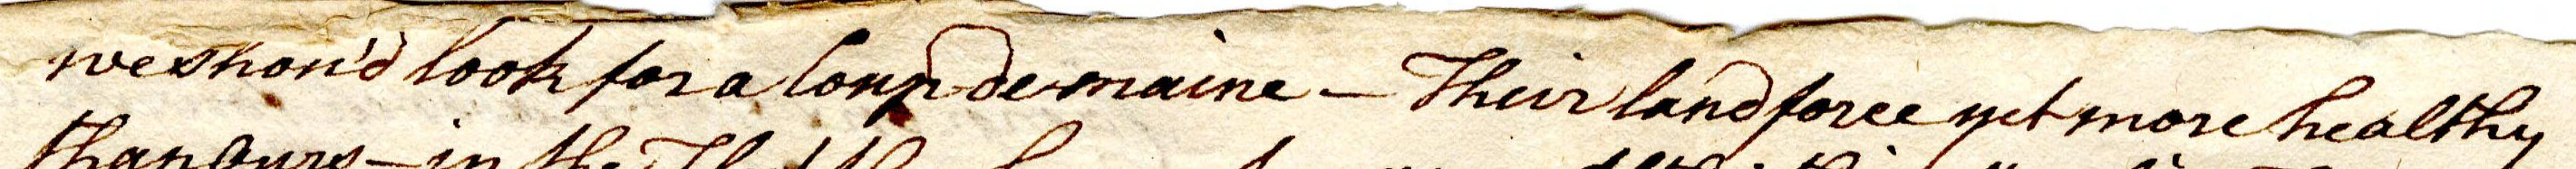we shou'd look for a Coup de maine- Their land force yet more healthy
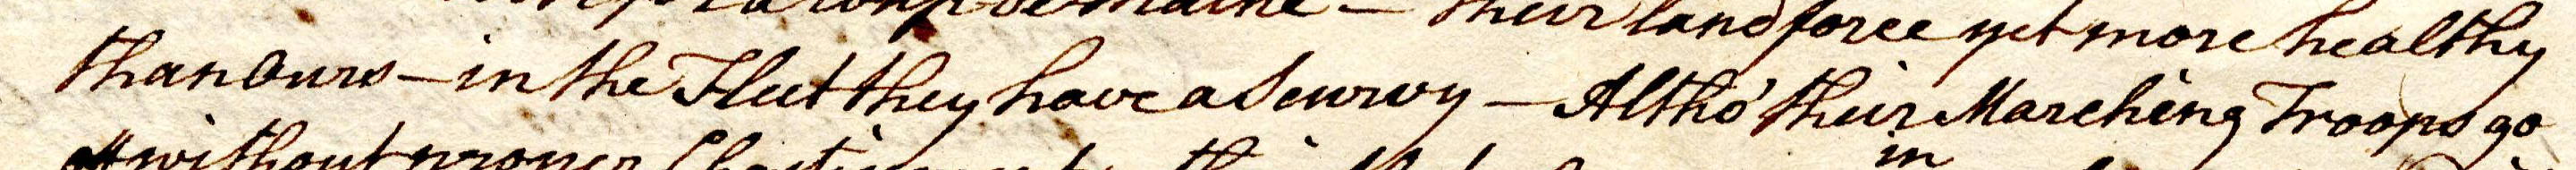than Ours- in the Hut they have Scurvy- Altho' their Marching Troops go
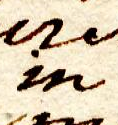in
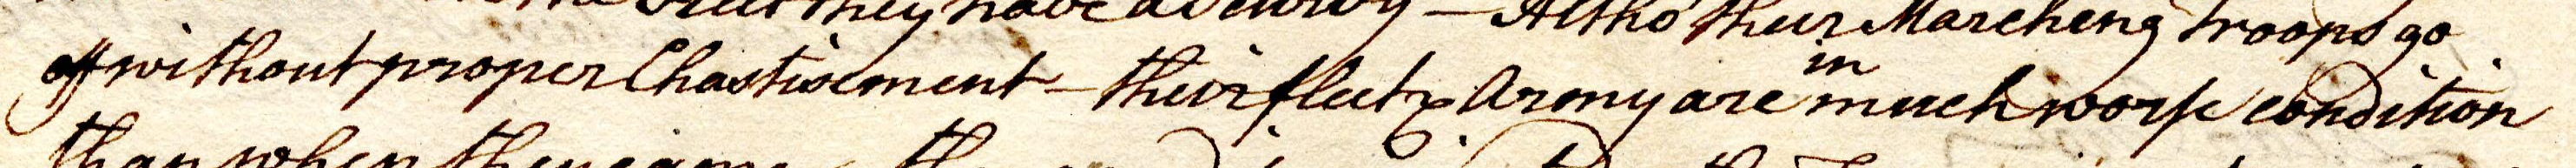of without proper Chastisement- their fleet & Army are much worse condition
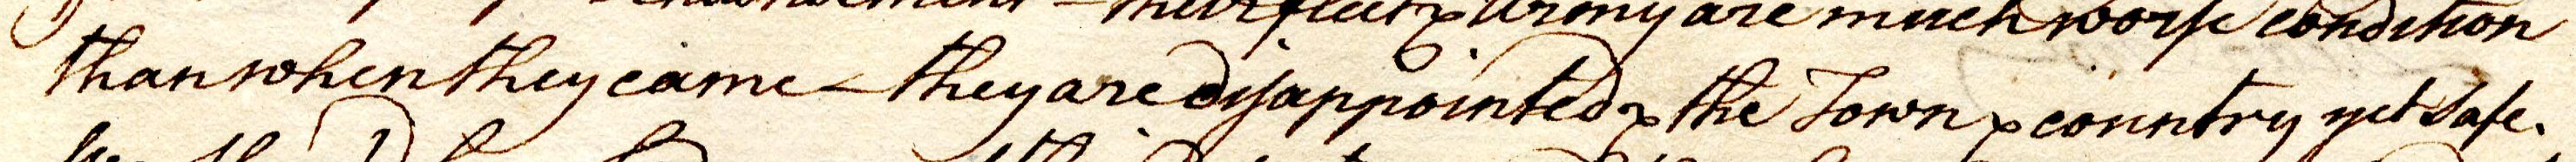than when they came- they are disappointed, the Town & country yet safe
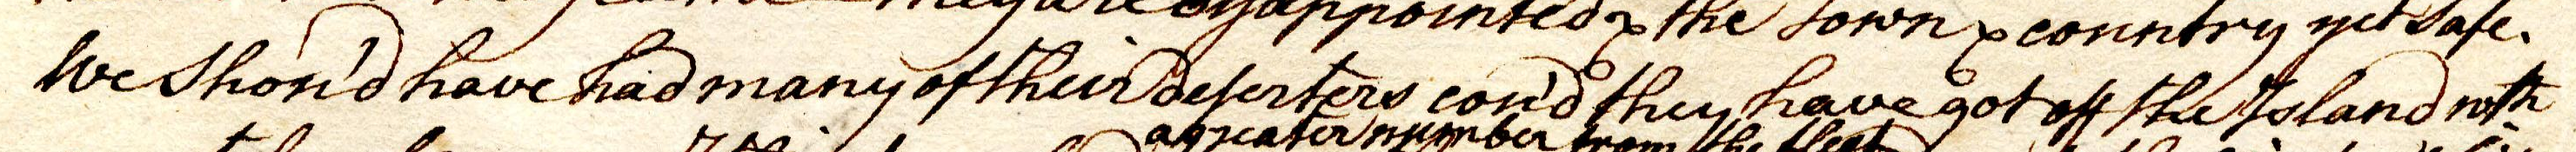We shou'd have had many of their deserters cou'd they have got off the Island with
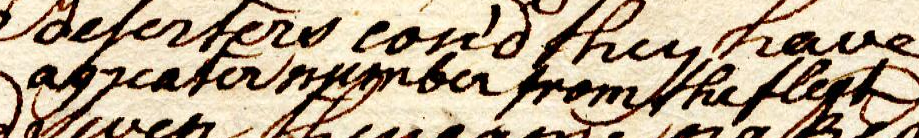a greater number from the fleet
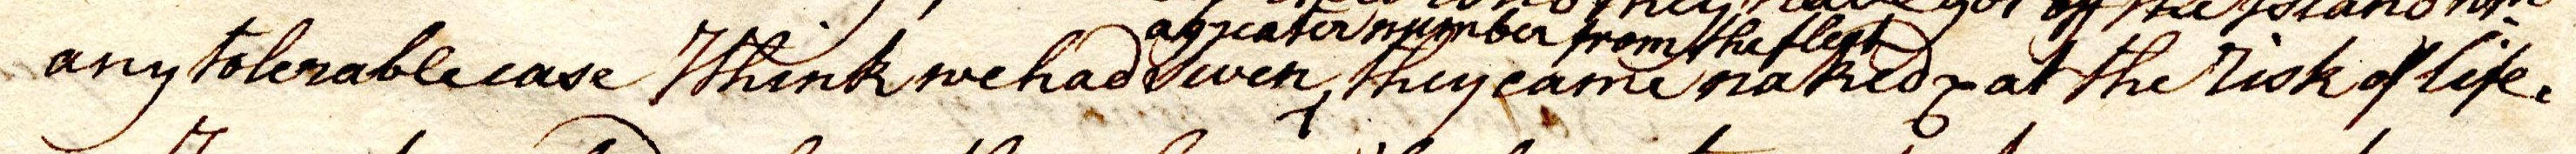any tolerable case I think we had ever ^ they came naked & at the rish of life.
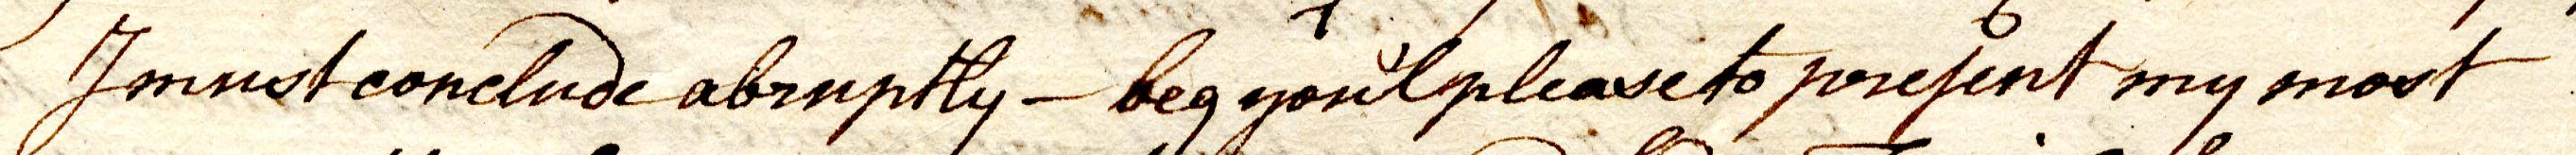I must conclude abruptly- beg you'l please to present my most
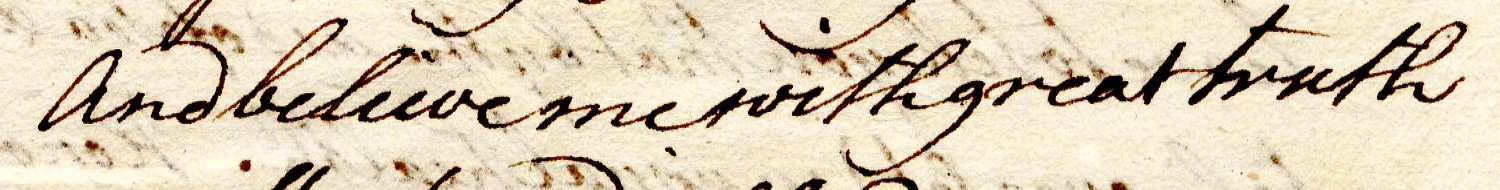And believe me with great truth
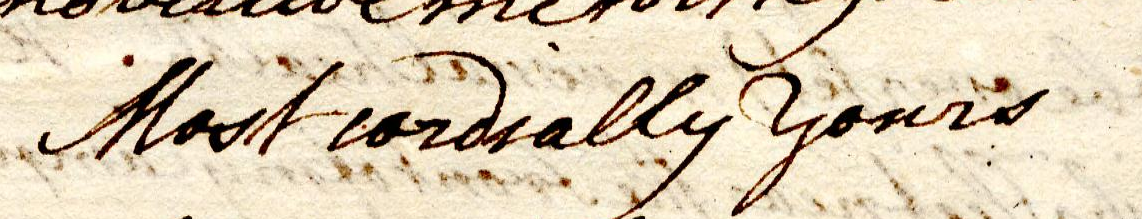Most cordially Yours
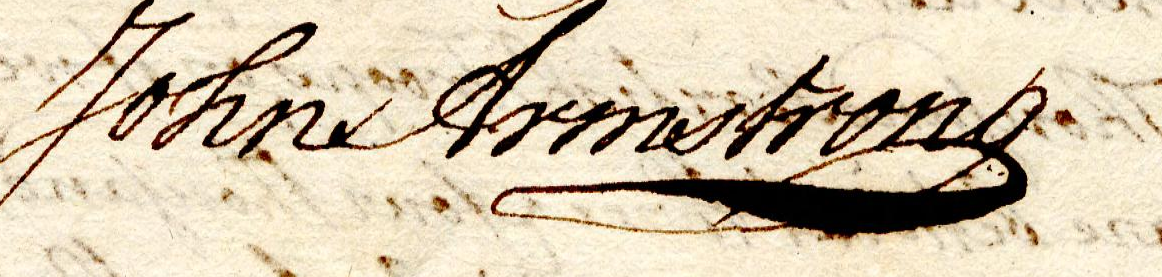John Armstrong
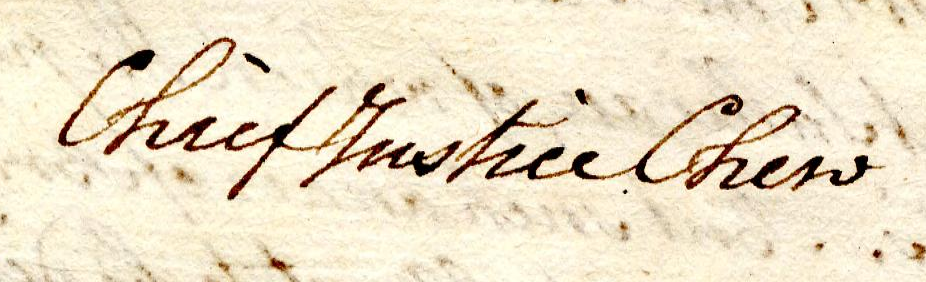Chief Justice Chew
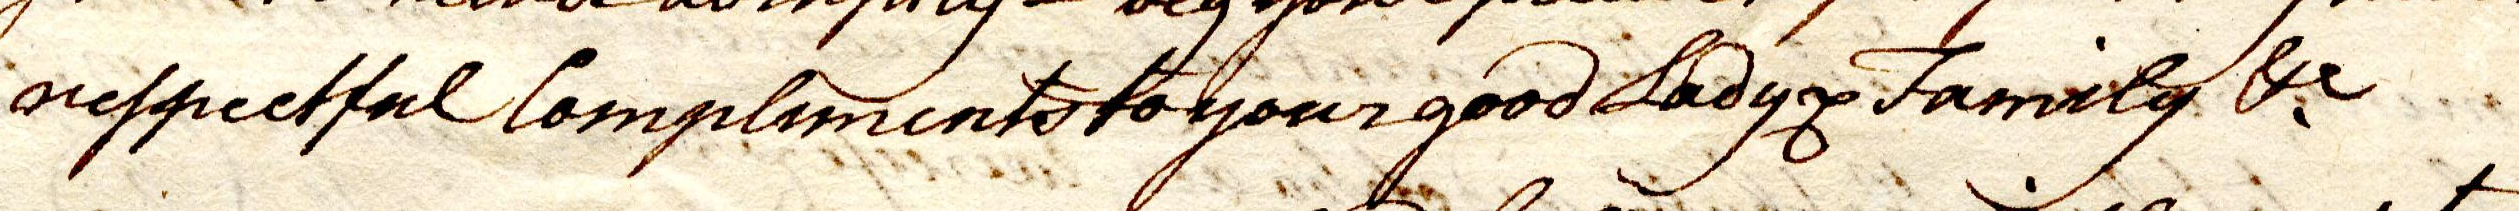respectful Complements to your good Lady & Family &c.
